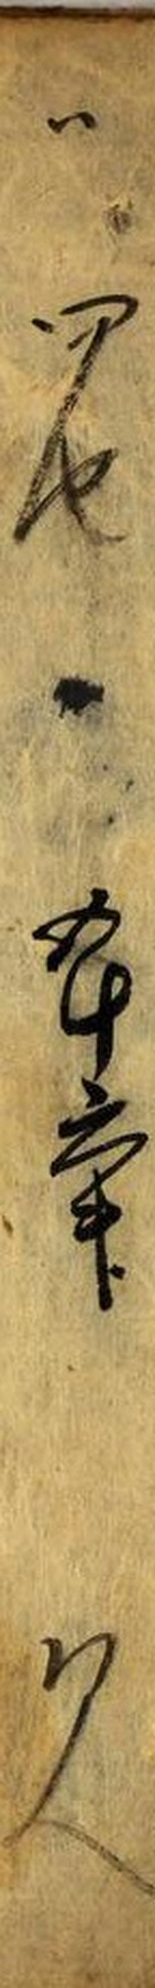同四セ五斗六升同人
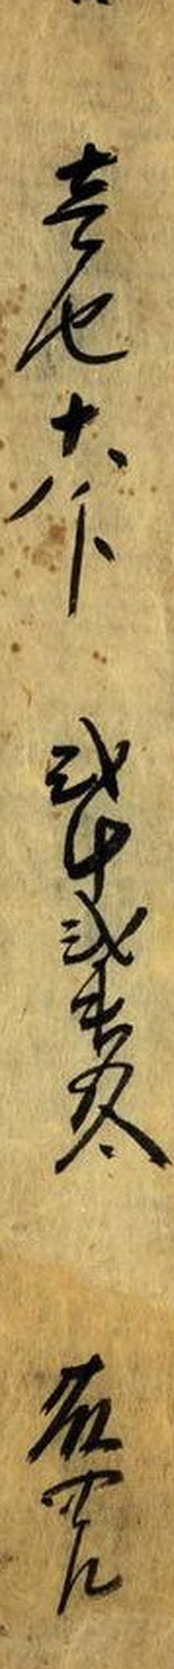同壱セ十八分弐斗弐升五合藤四郎
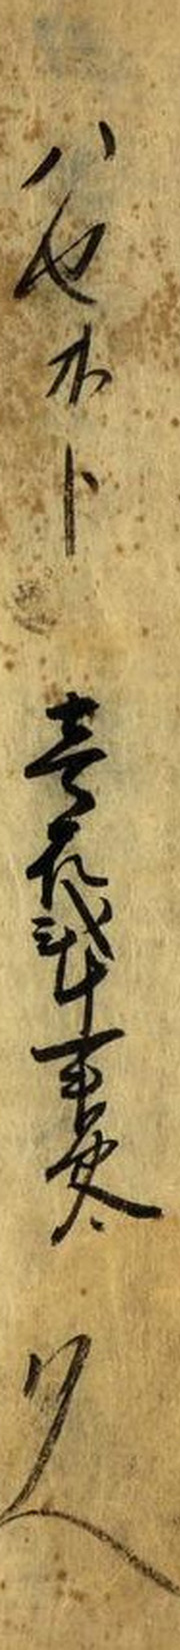同八セ廿分壱石弐斗一升四合同人
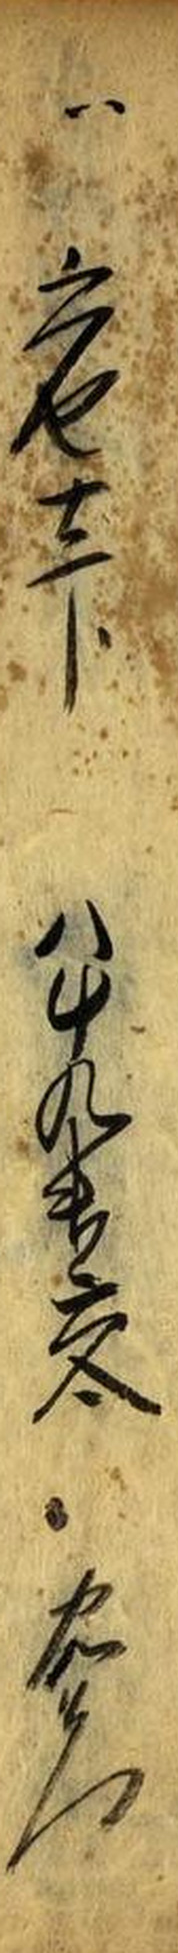同六セ十二分八斗九升六合忠右衛門
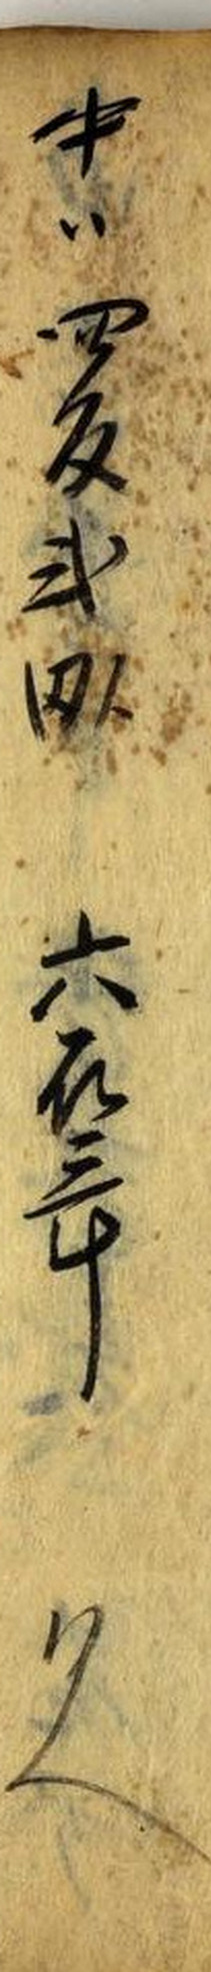中同四反弐畝六石三斗同人
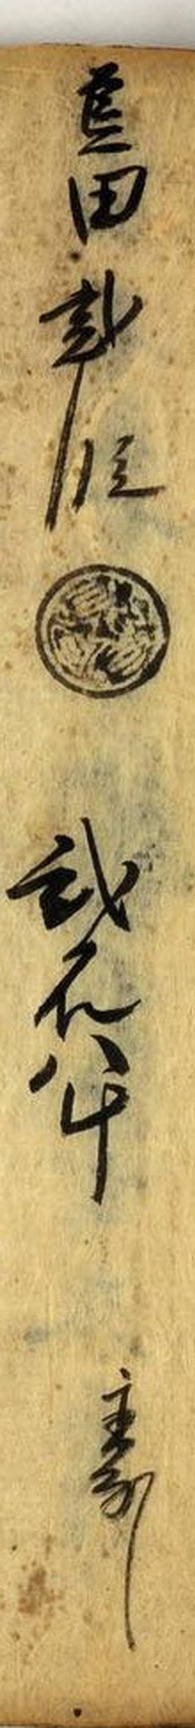荒田弐段㊞弐石八斗主なし
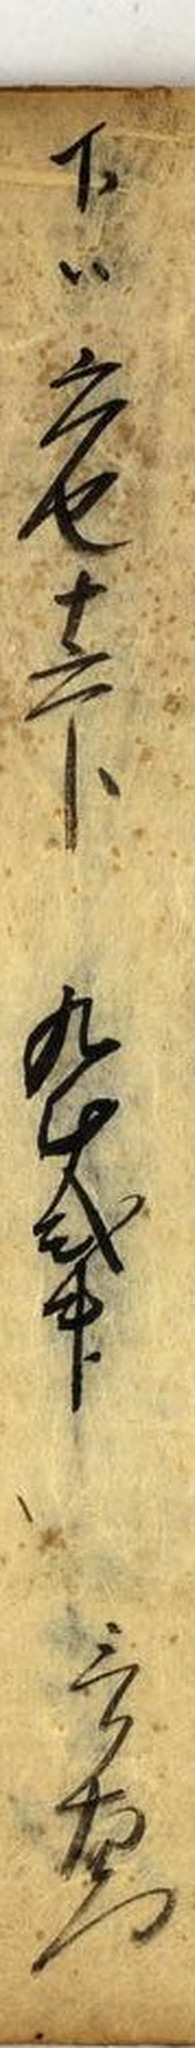下同六セ十六分九斗弐升三郎左衛門
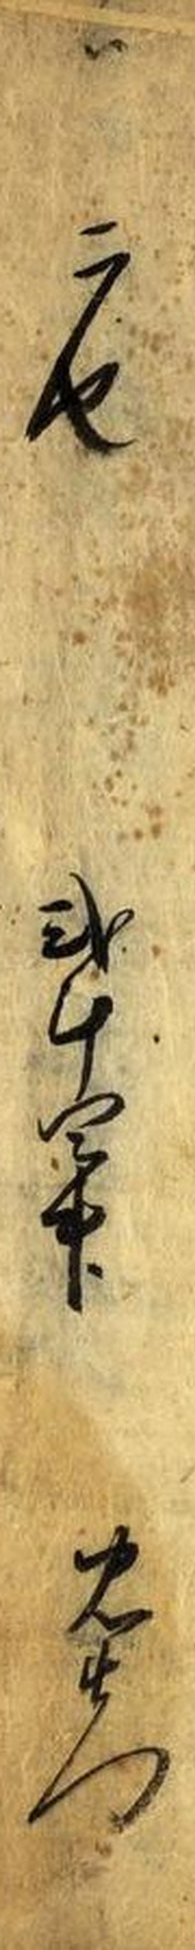同二セ弐斗四升忠右衛門
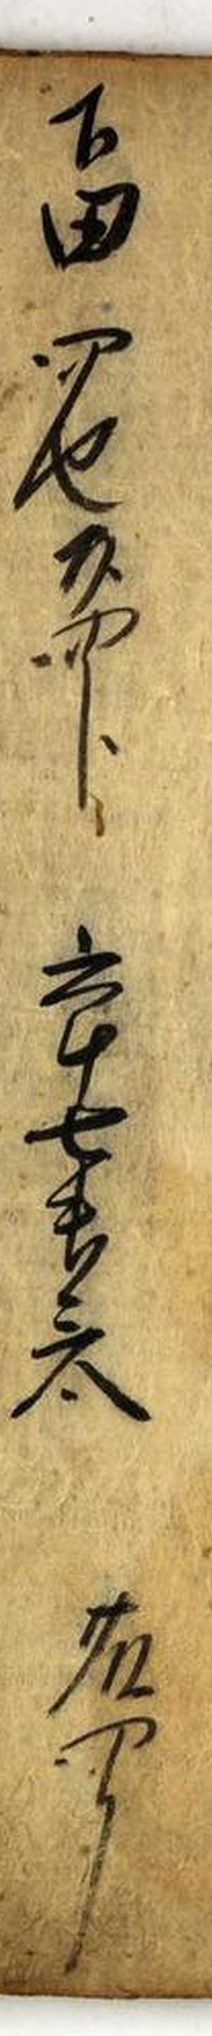下田四セ廿四分六斗七升三合藤四郎
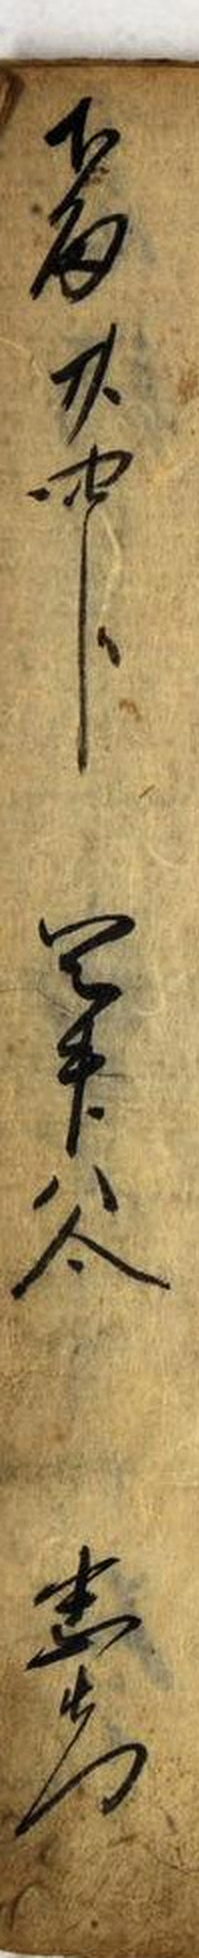下畠廿四分四升八合忠右衛門

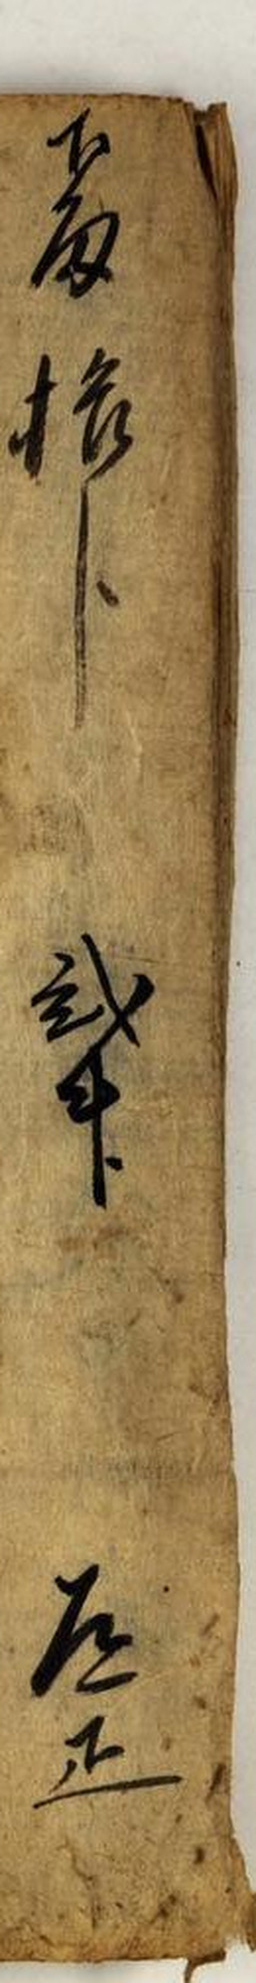下畠拾分弐斗道正
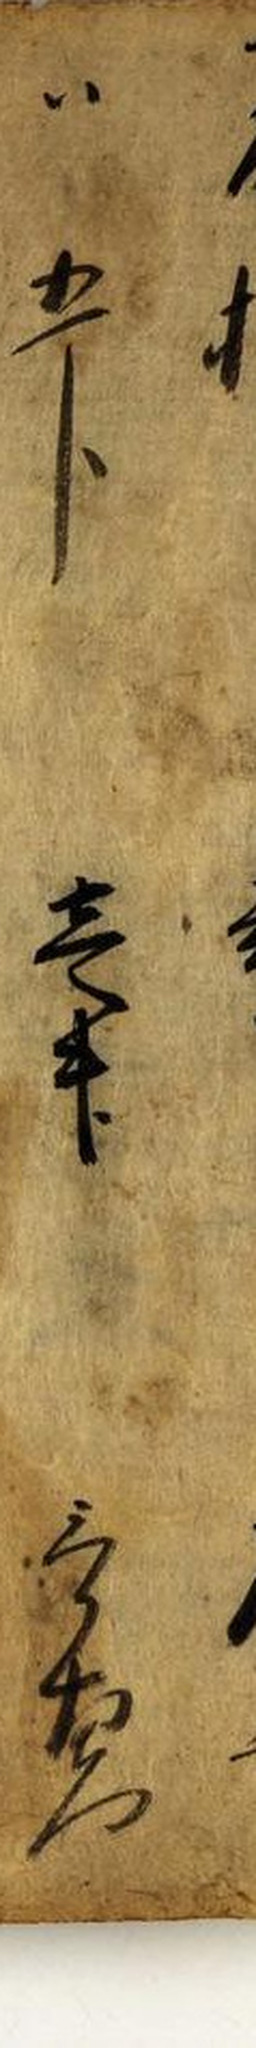同五分壱升三郎左衛門
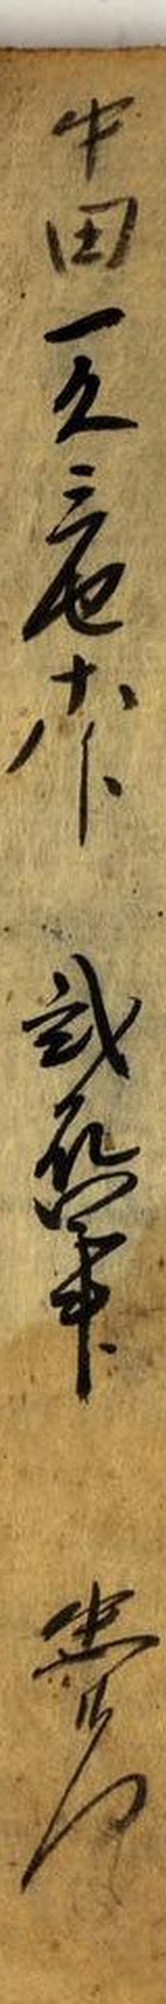中田一反三セ十八分弐石四升忠右衛門
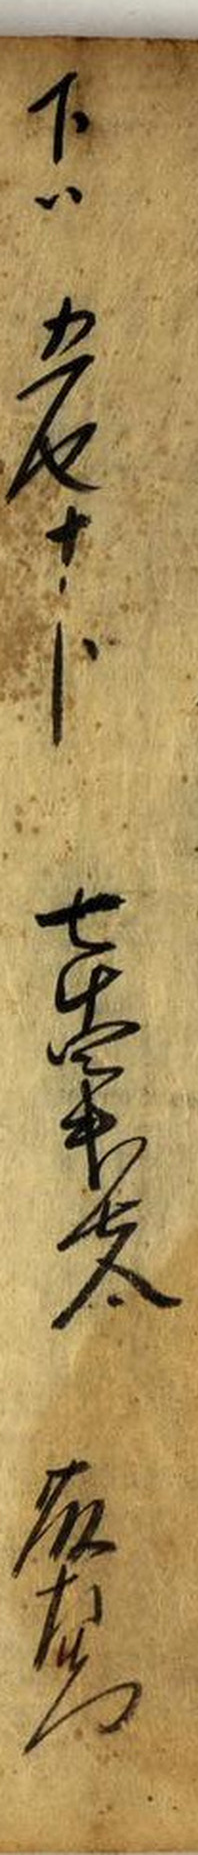下同五セ十分七斗四升七合藤左衛門
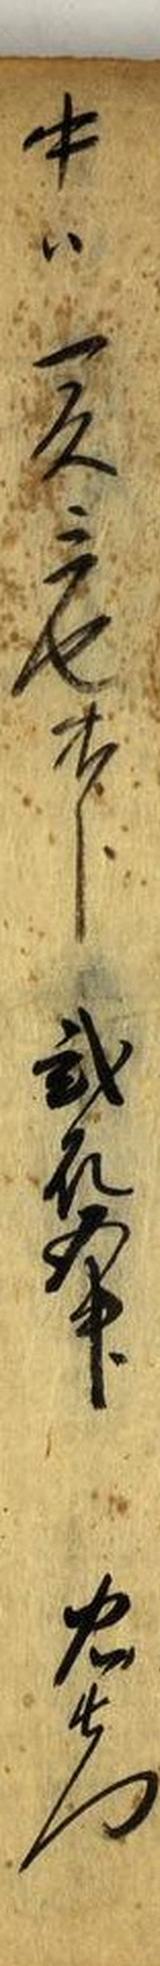中同一反三セ廿分弐石五升忠右衛門
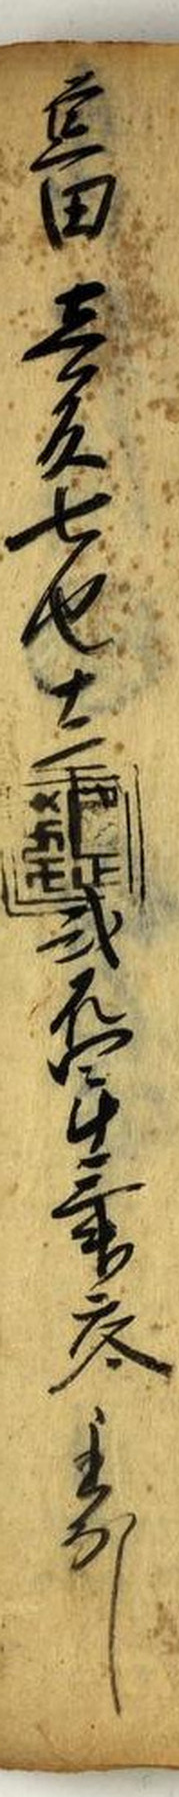荒田壱反七セ十二分弐石四斗三升六合主なし
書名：越前国西方内志津庄内本折村御検地帳
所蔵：福井県文書館 Fukui Prefectural Archives
